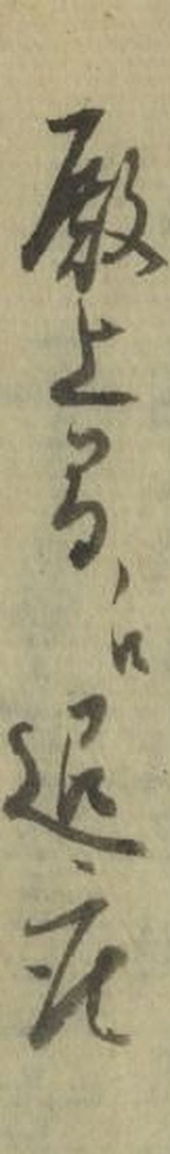殿上間え退座

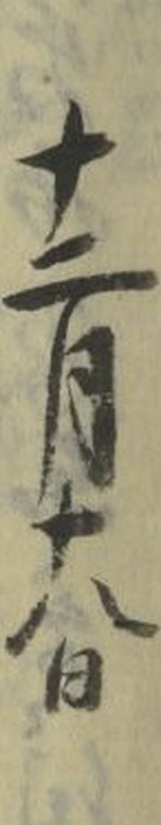十二月十八日
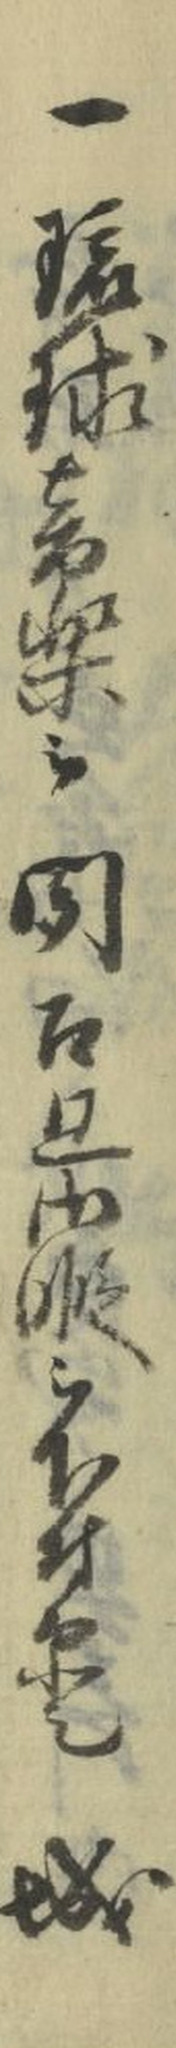一琉球音楽被聞召且御暇被下付登城
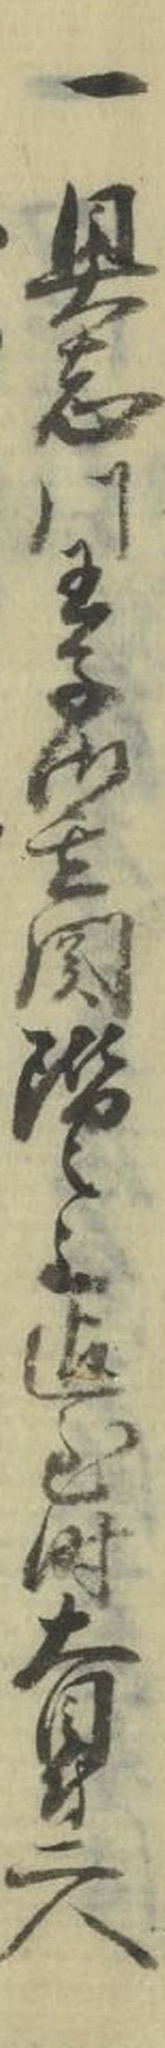一具志川王子御玄関階之上迄至時大目付二人
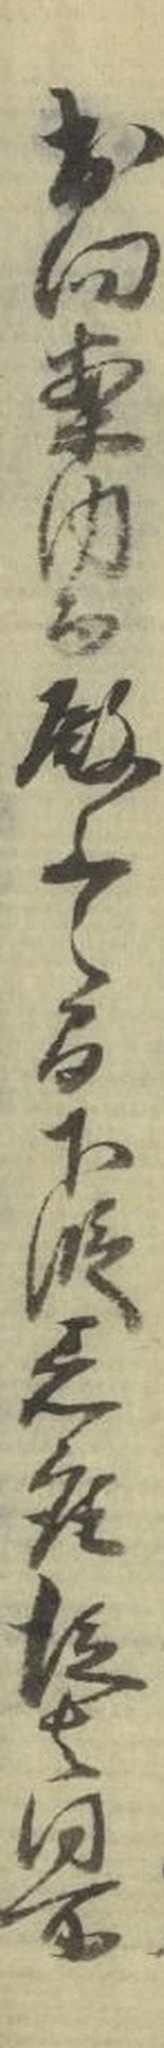出向案内而殿上之間下段着座従者同所
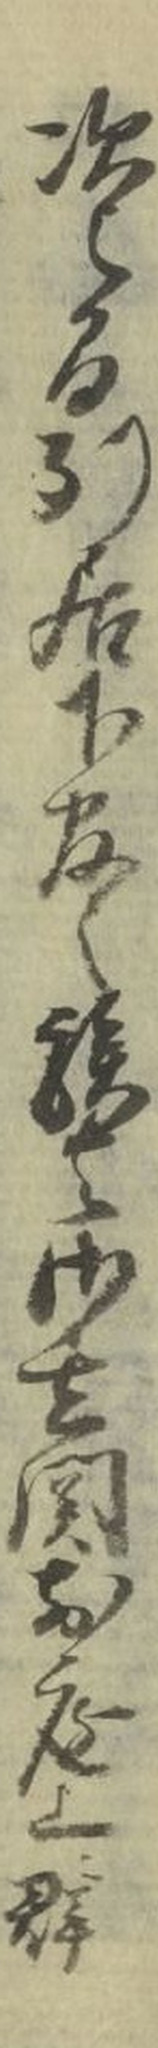次之間列居下官之族は御玄関前庭上群
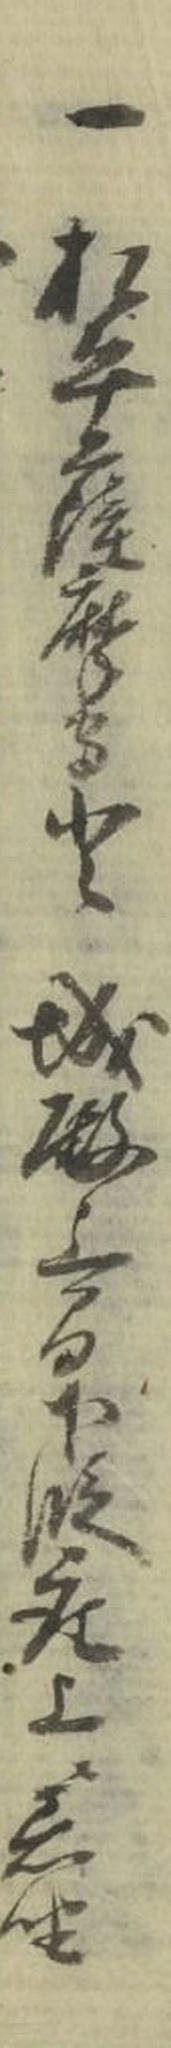一松平薩摩守登城殿上間下段座上に着座
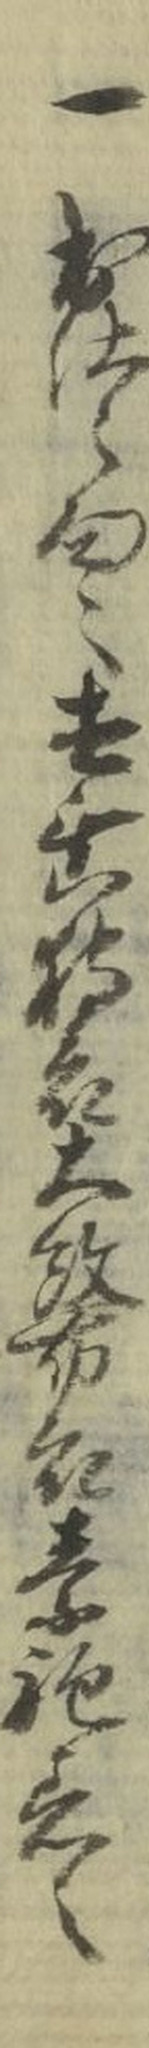一出仕之面々直垂狩衣大紋布衣素袍着之
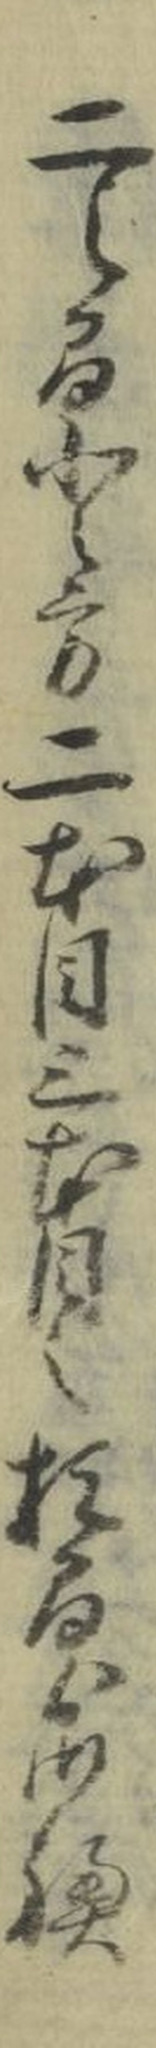一大広間北之方二本目三本目之柱間ゟ御襖

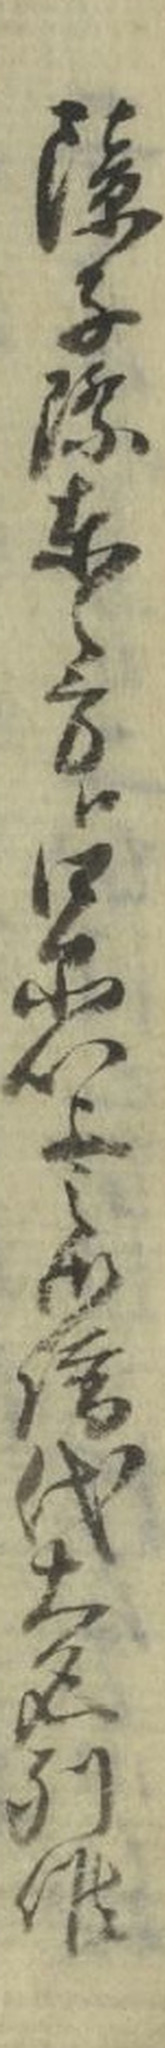障子際東之方え四品以上之御譜代大名列候
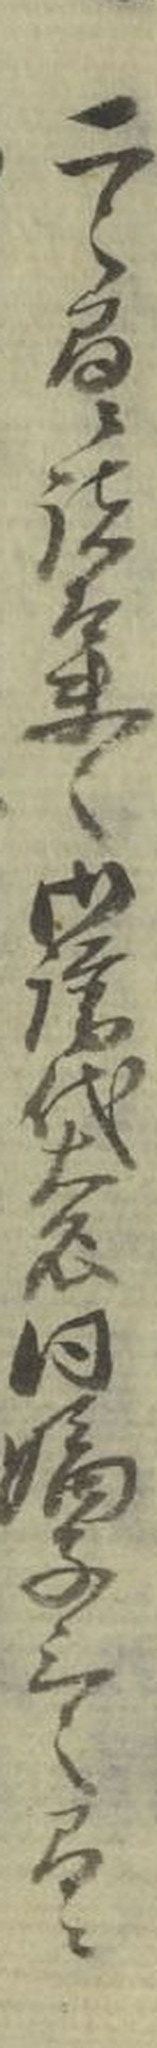一二之間に諸太夫之御譜代大名同嫡子三之間に
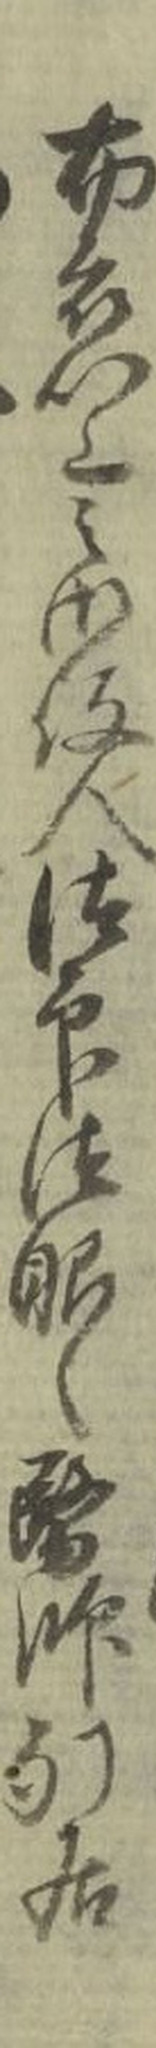布衣以上之御役人法印法眼之医師列居
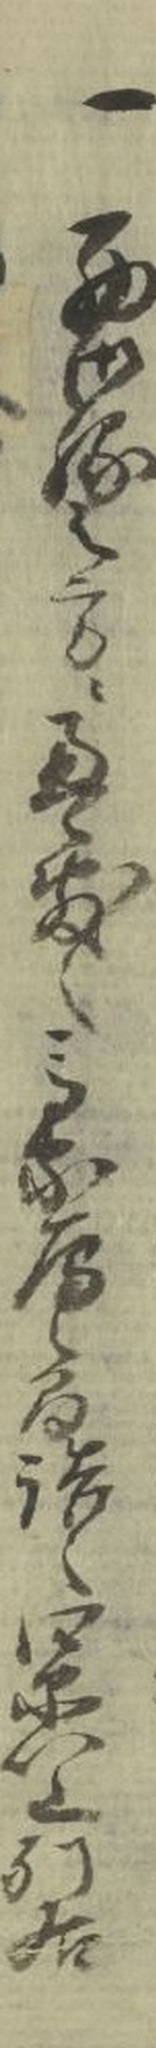一西御縁之方に畳敷之高家鴈之間詰之四品以上列居
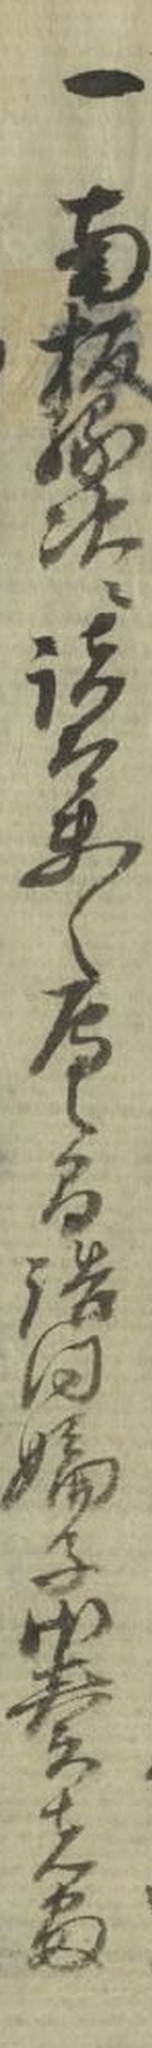一南板縁次に諸太夫之雁之間詰同嫡子御奏者番
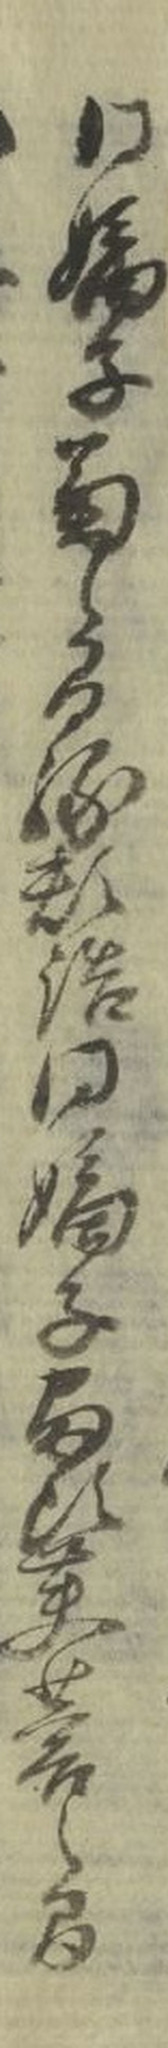同嫡子南之間縁頬詰同嫡子番頭芙蓉之間
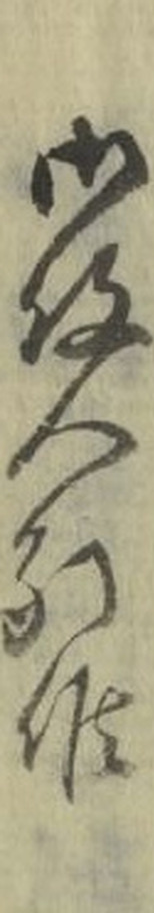御役人列候
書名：戊辰琉球人来朝之式 全
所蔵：University of the Ryukyus Library
